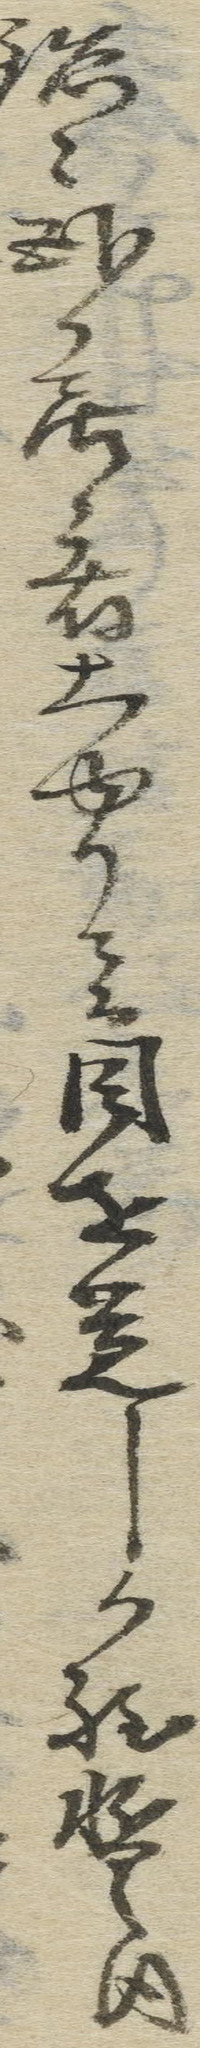銘々臥り居候者大ゆり二而目を覚し候程暫之内
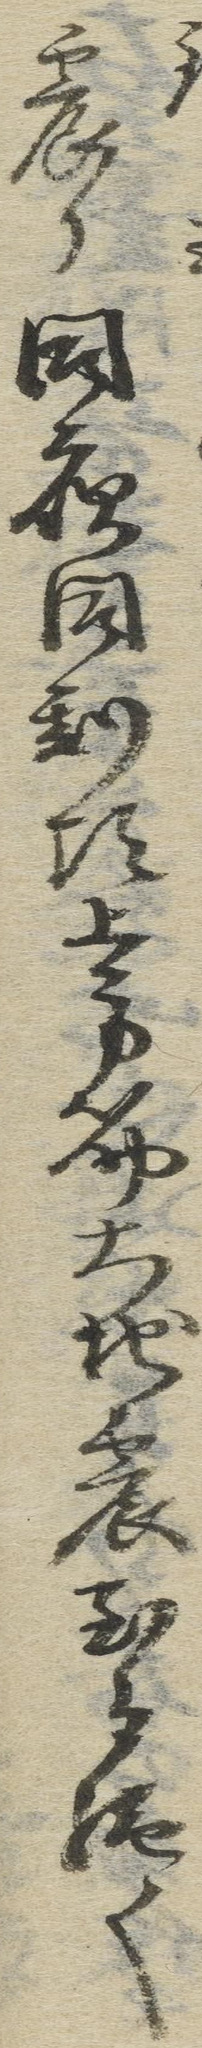震り同夜同刻頃上方筋大地震至而強く
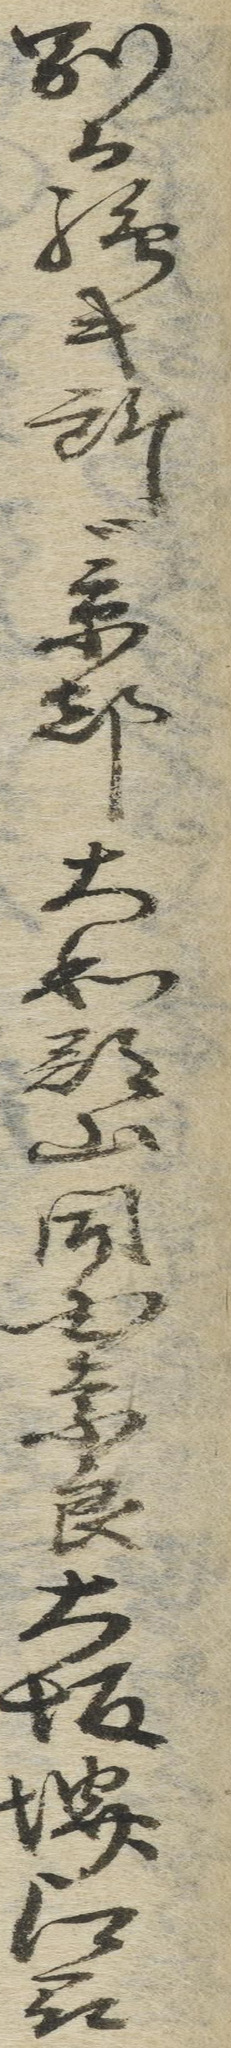別而強キ所ハ京都大和郡山同国奈良大坂堺江州
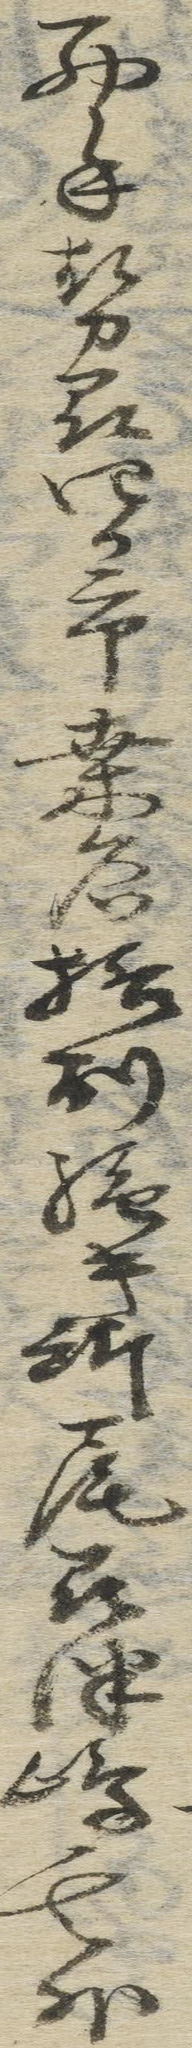西手勢州四日市桑名格別強キ所尾州津嶋其外
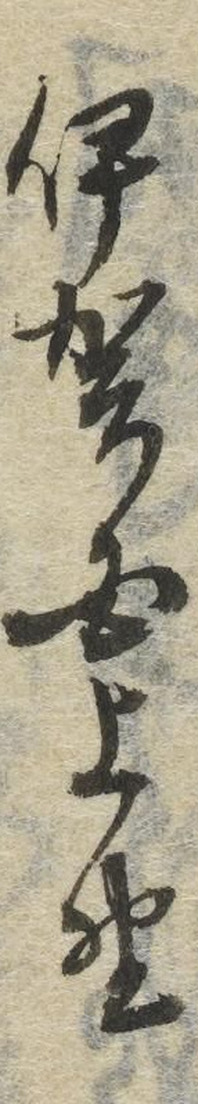伊賀国上野
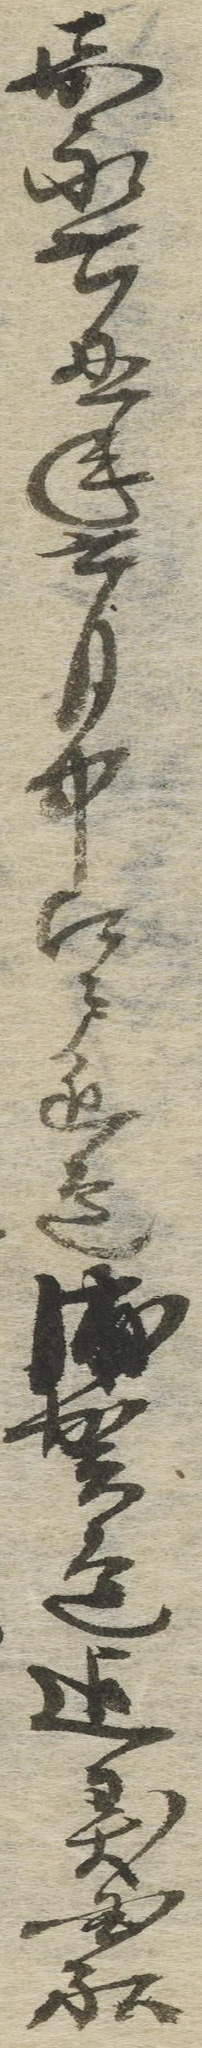嘉永六丑年六月中江戸近辺浦賀辺迄異国船
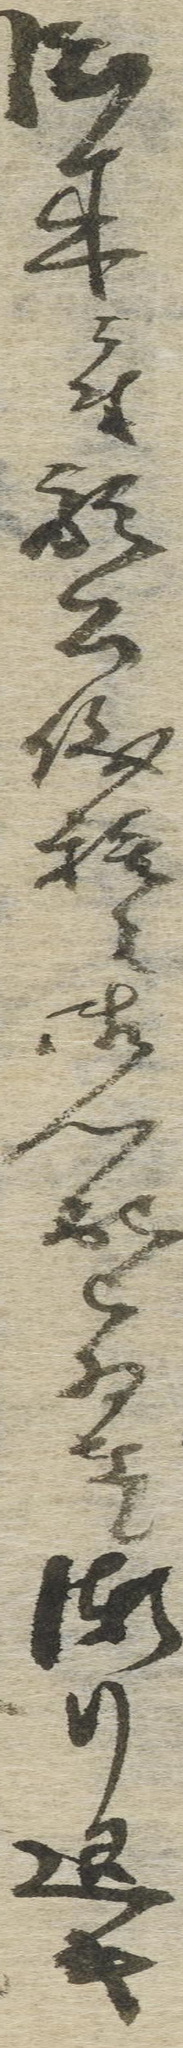到来二付於公儀種々御心配被為在候漸引退キ
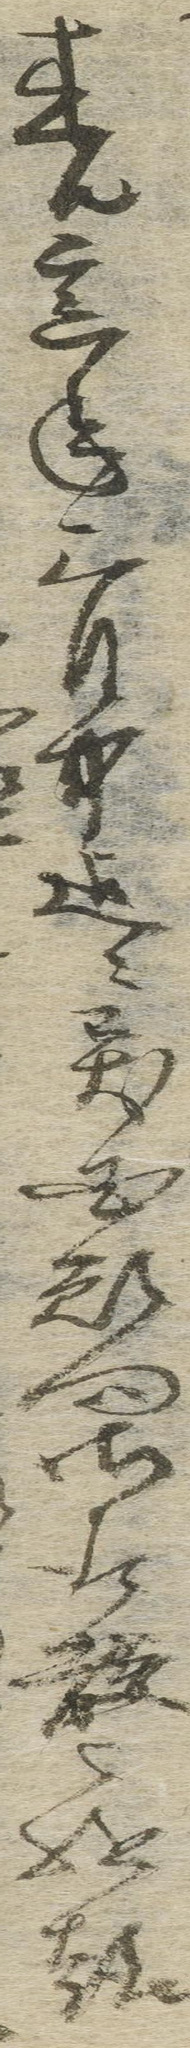来ㇽ寅年三月中迄二異国願向御取致被遊趣
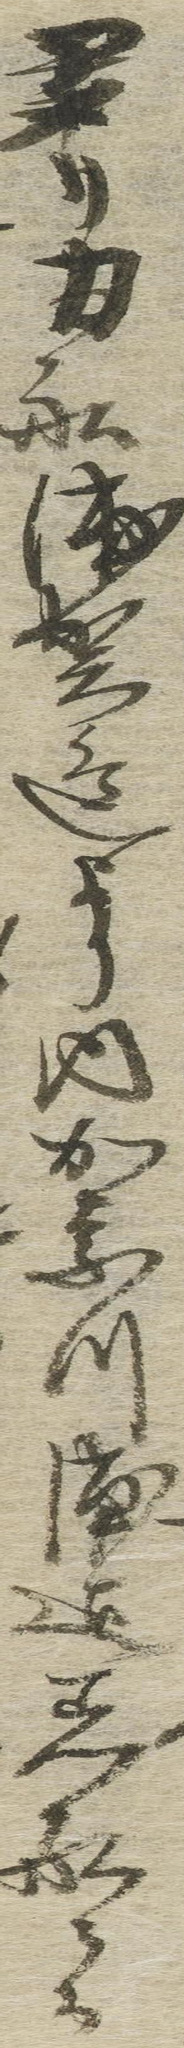アメリカ船浦賀辺より内かな川浦辺迄着船二而
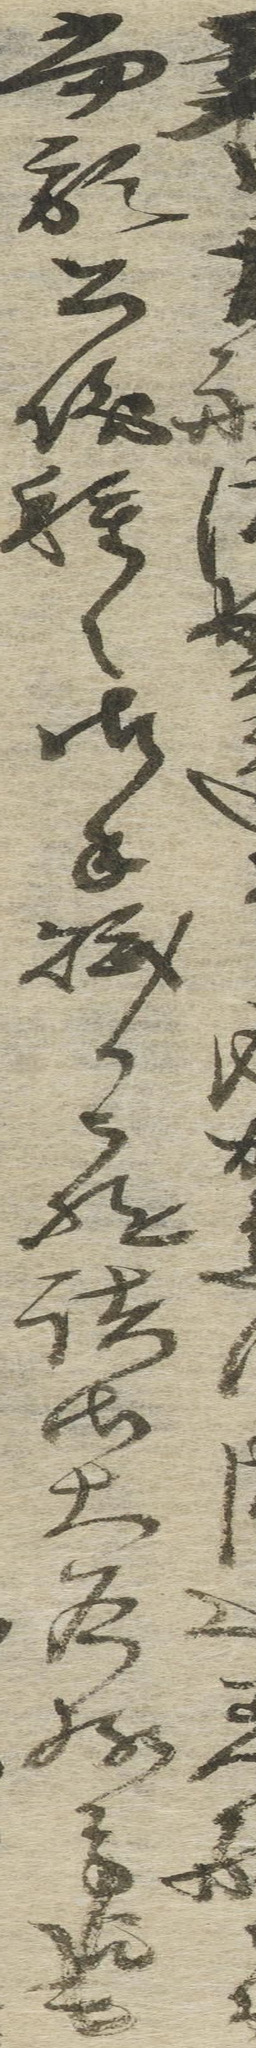尚於公儀種々御手賦り被遊諸御大名様方江も
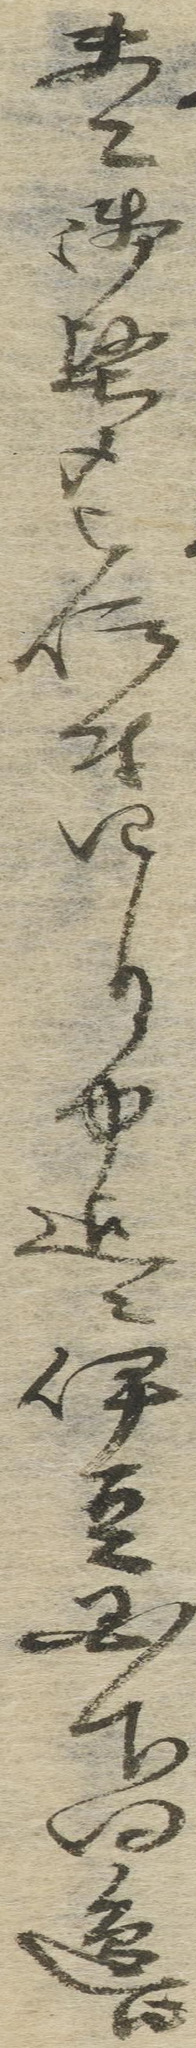夫々御堅メ被仰付四月中迄二伊豆国下田辺江

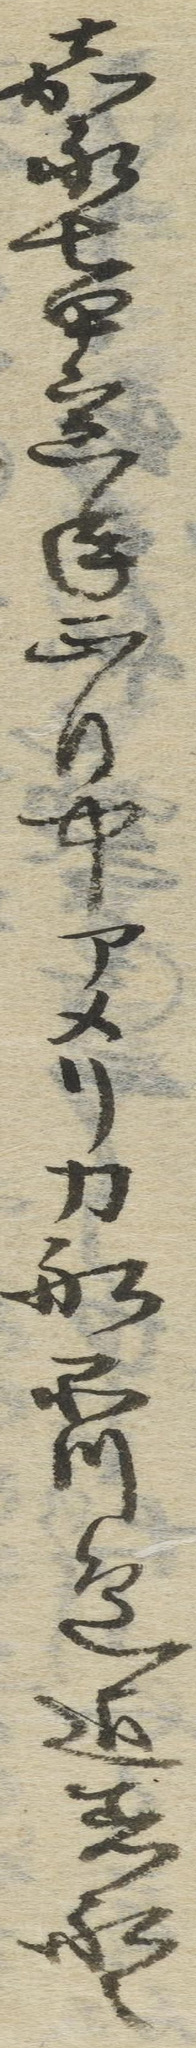嘉永七甲寅年正月中アメリカ船品川辺迄着船之
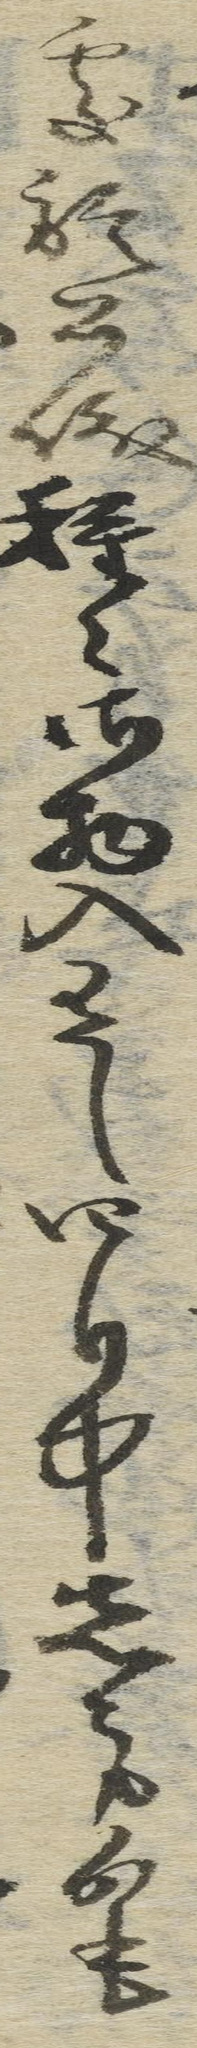処於公儀種々御物入有之四月中先方ゟも
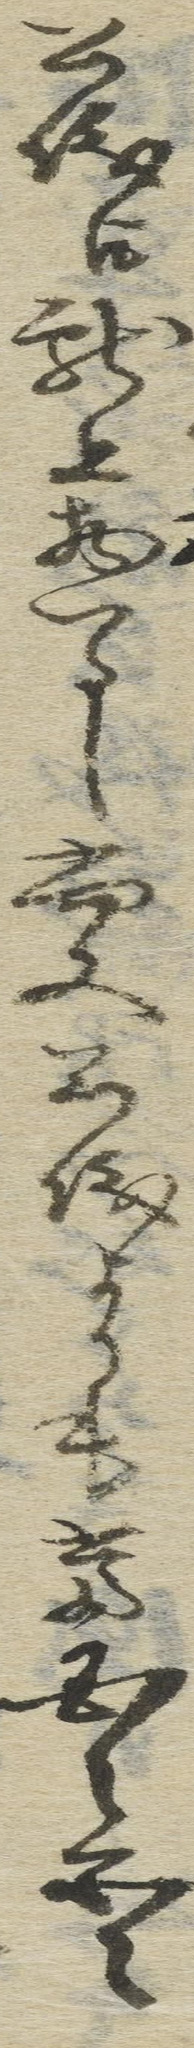公儀江献上物いたし尚又公儀よりも当国之品々
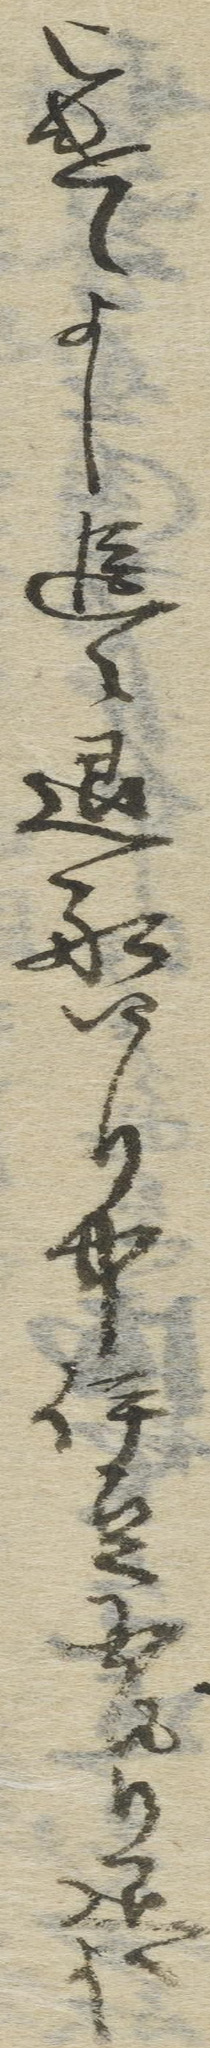被遣候よし追々退船四月中伊豆国より退候よし
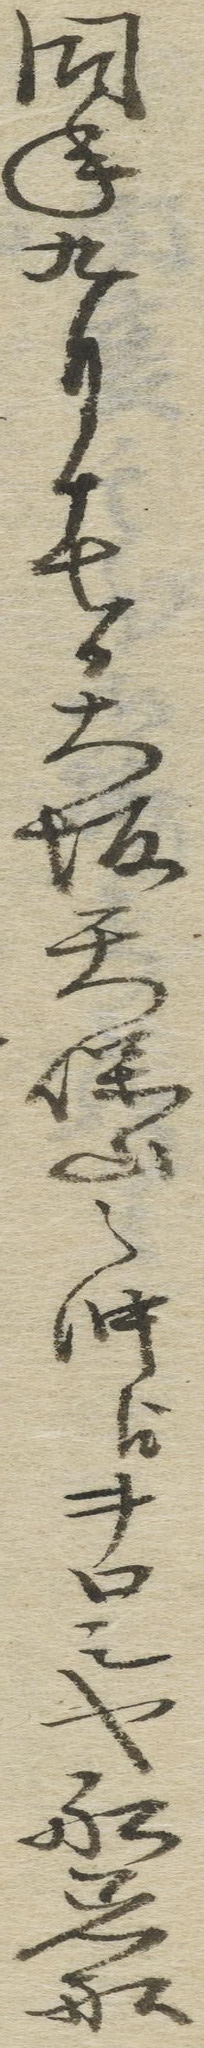同年九月十七日大坂天保山之沖江ヲロシヤ船着船
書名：信濃越後　地震書留
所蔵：東京大学地震研究所図書室 Earthquake Research Institute Library, The University of Tokyo, JAPAN
